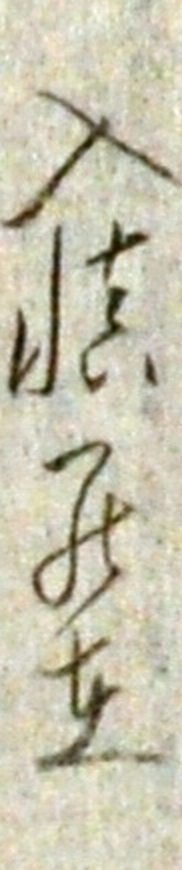入慎罷在
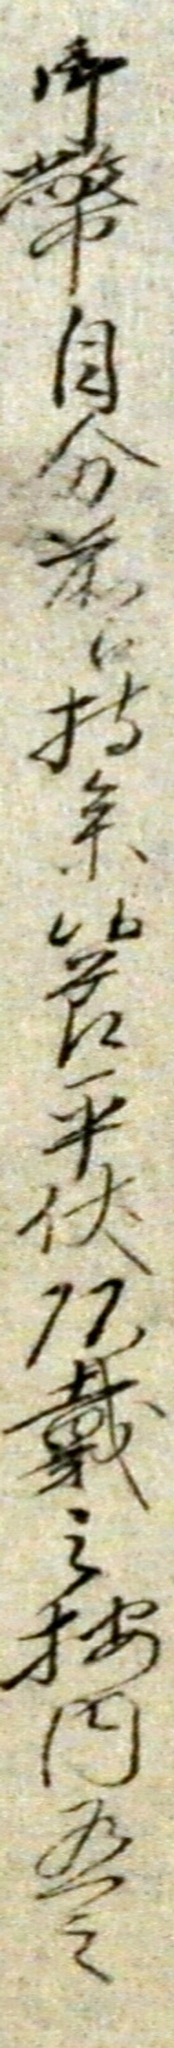御幣自分前江持参候節平伏頂戴之按内有之
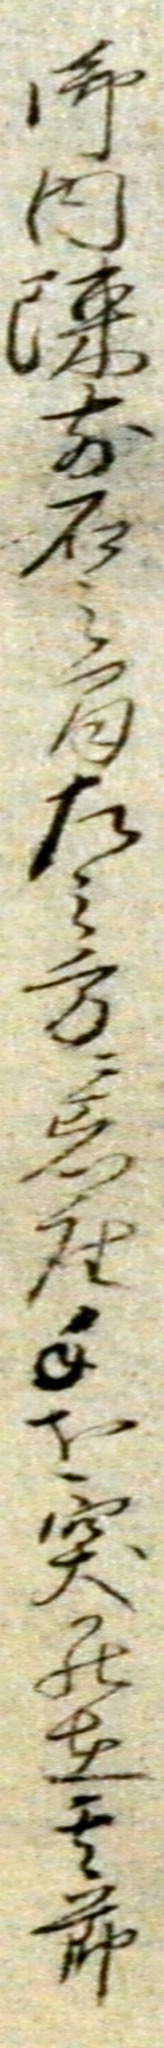御内陣前石之間左之方ニ着座手を突罷在其節
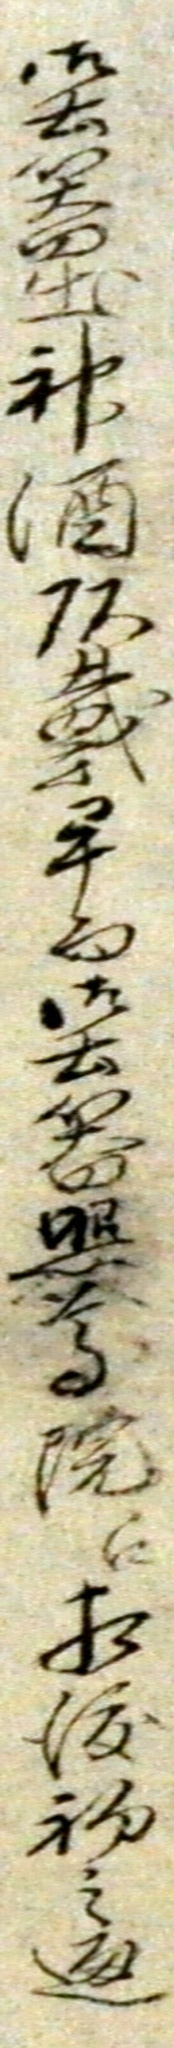御土器出神酒頂戴畢而御土器照尊院江相渡初之通
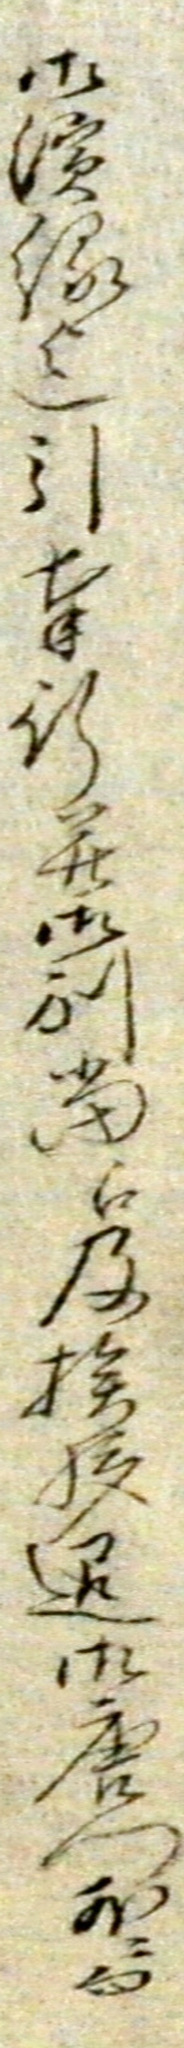御縁頬迄引奉行幷御別当江及挨拶退御唐門外ニ而
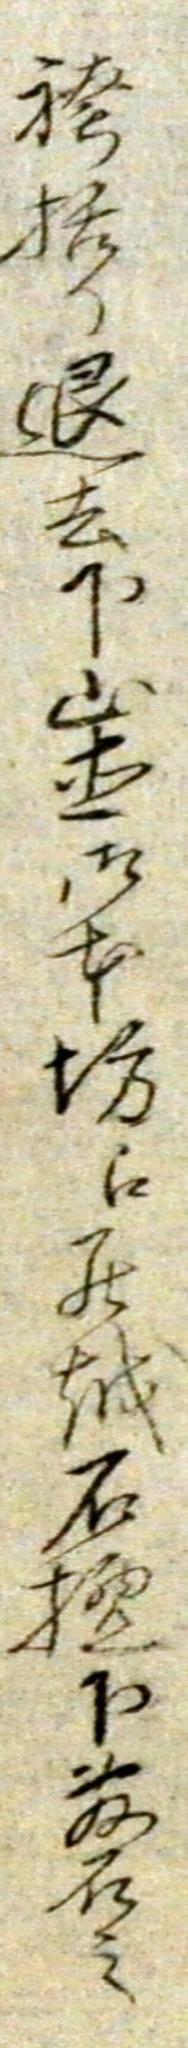袴括り退去下山直御本坊江罷越石檀敷石之
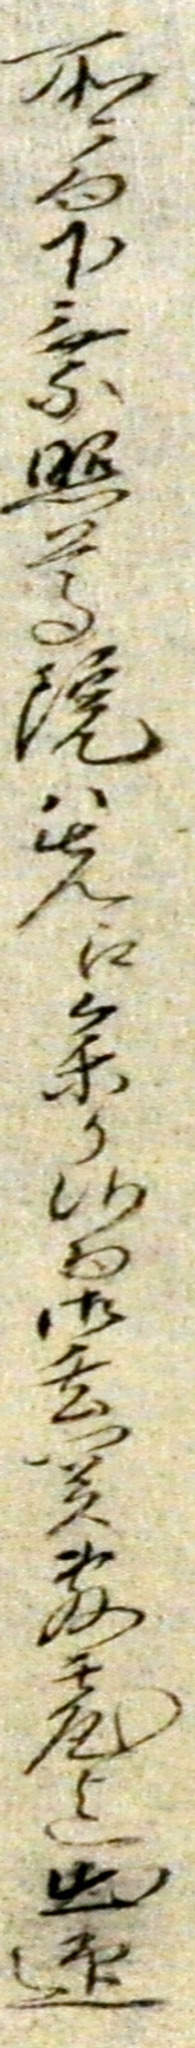所ニ而下乗照尊院ハ先江参り候而御玄関敷臺迄出迎
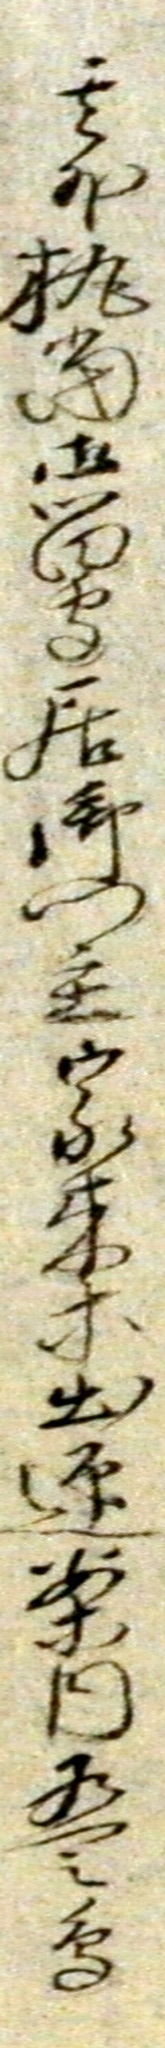其外執当御留守居御門主家来抔出迎案内有之鳥渡
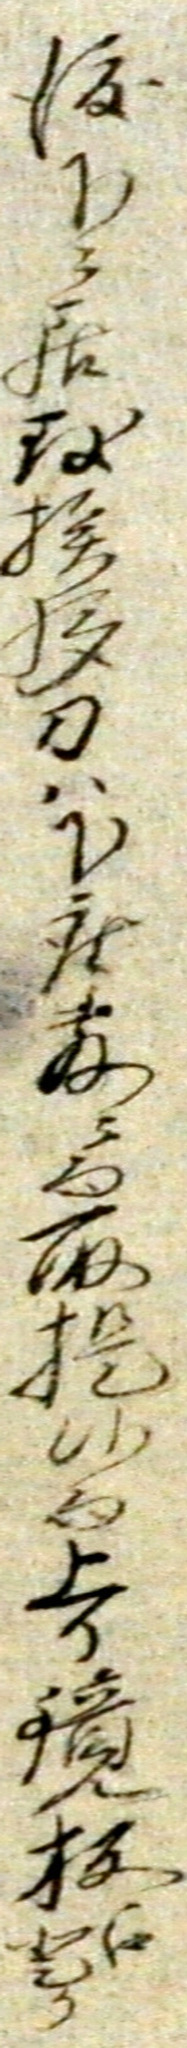下二居致挨拶刀ㇵ下座ニ而取提候而上り鏡板江登り
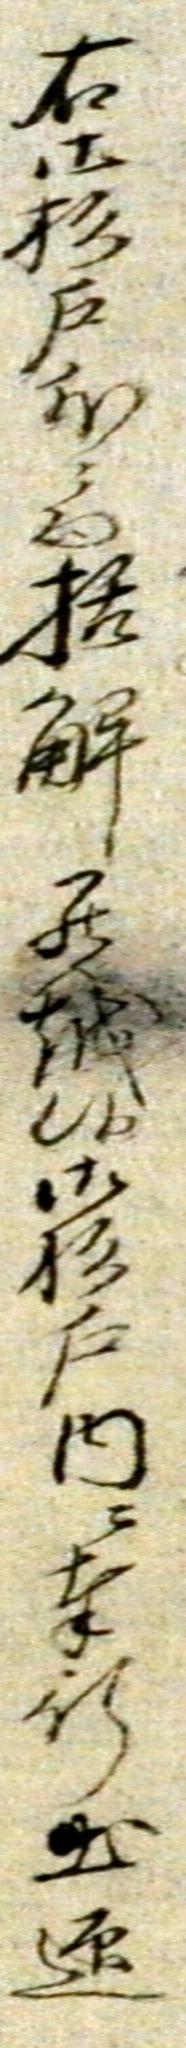右御杉戸外ニ而括解罷在候御杉戸内ニ奉行出迎
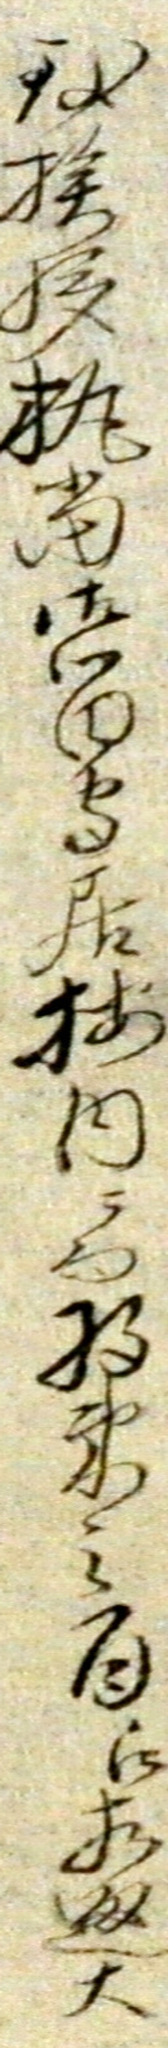致挨拶執當御留守居按内ニ而之間江相通大
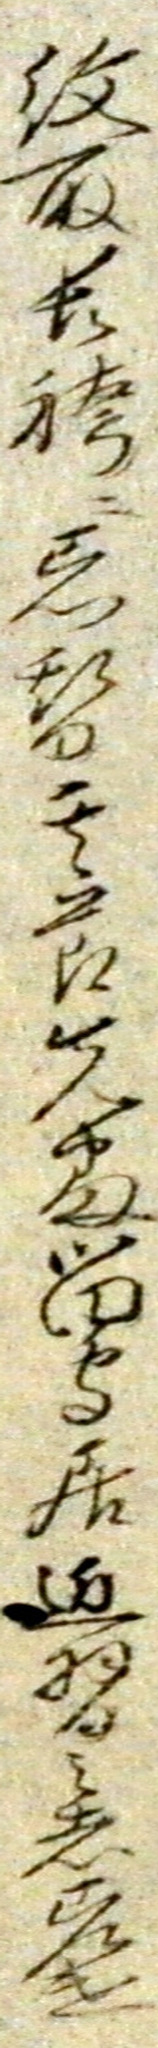紋取長袴二着替其節先両留守居近習之者差遣
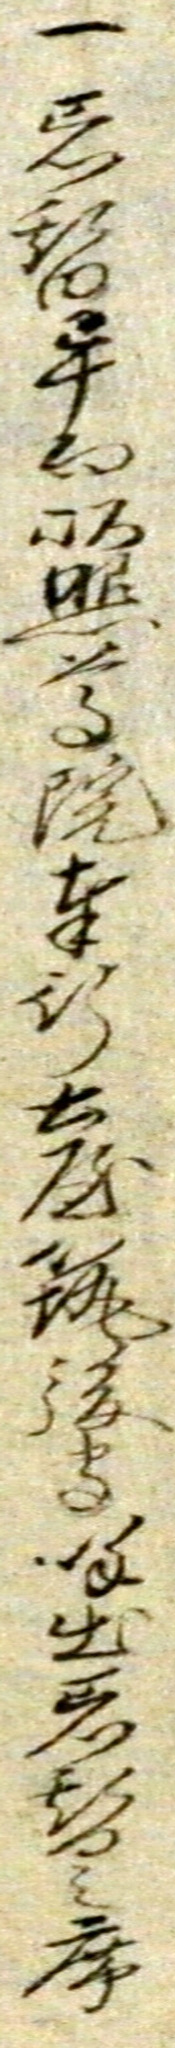一着替畢而以照尊院奉行土屋筑後守呼出着替之席
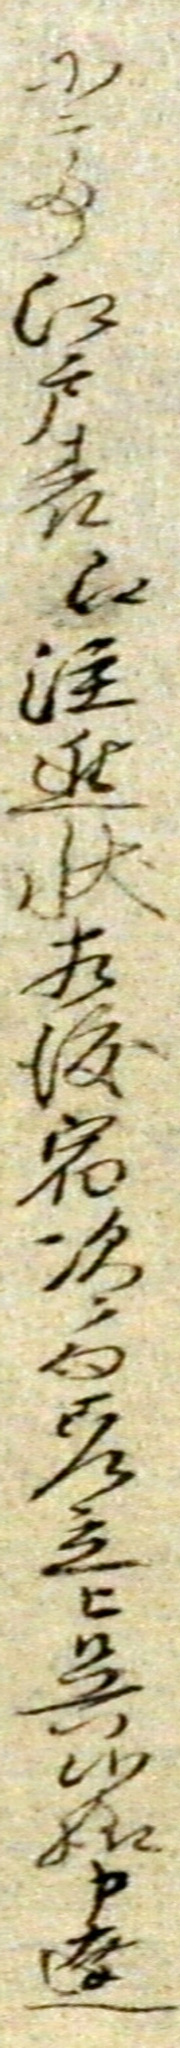尓亭江戸表江注進状相渡宿ニ而差立ヒ呉候様申達
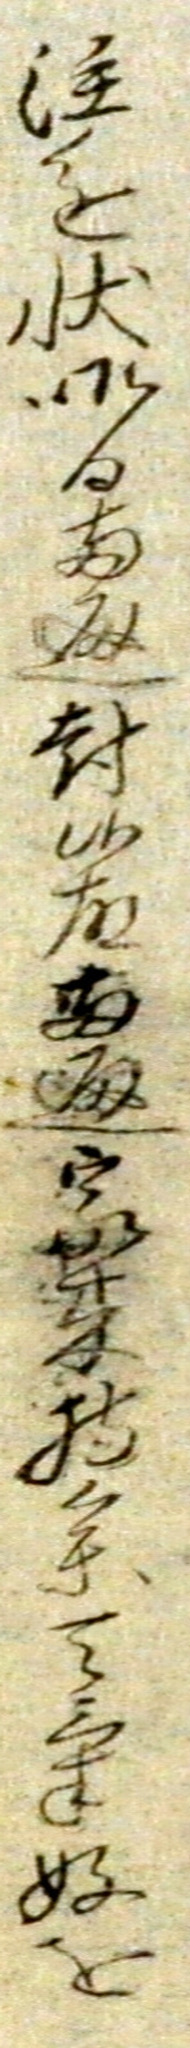注進状昨日両通封候尤両通家来持参天気好を
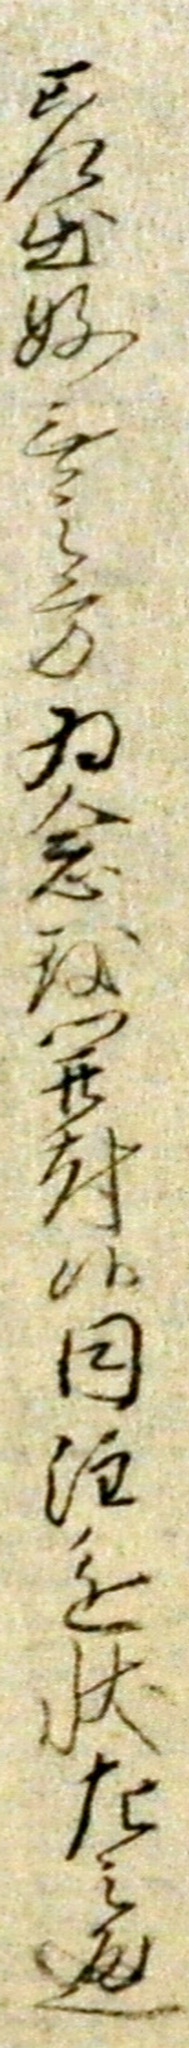差出好無之方為念致開封候注進状左之通
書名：日光御名代相勤候節ノ留
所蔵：伊那市立高遠町図書館・合同会社AMANE
